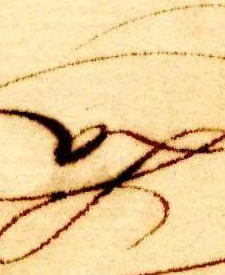To
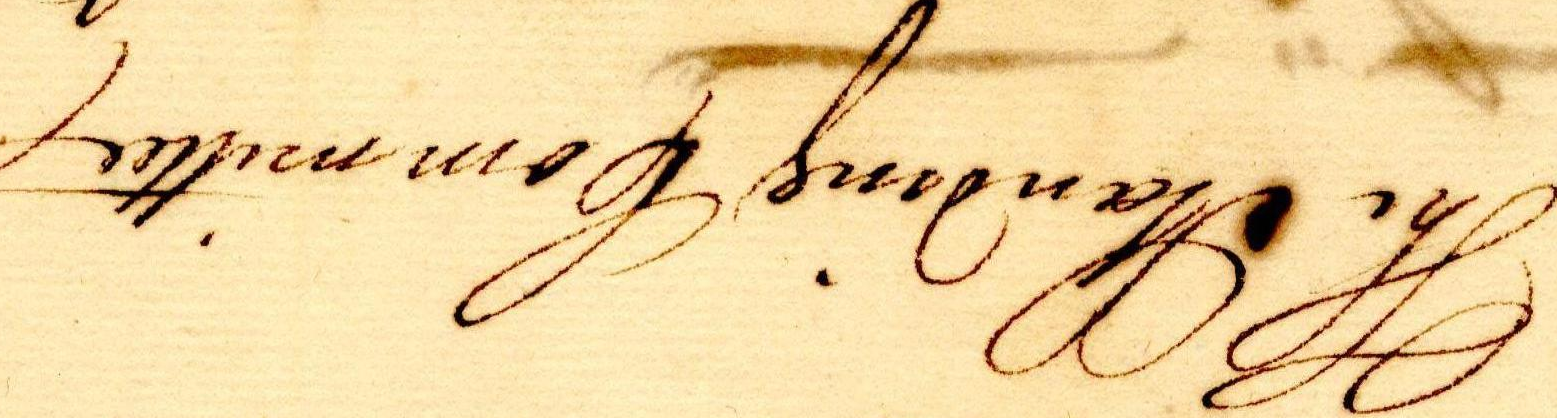The Standing Committee
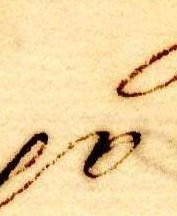at
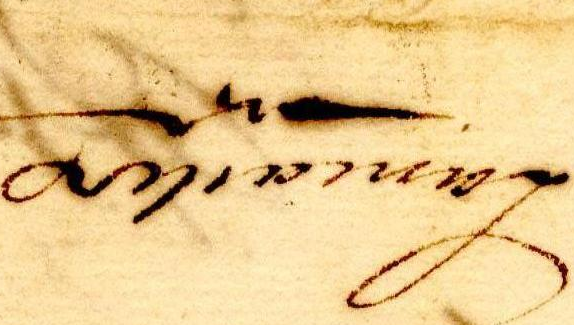Lancaster
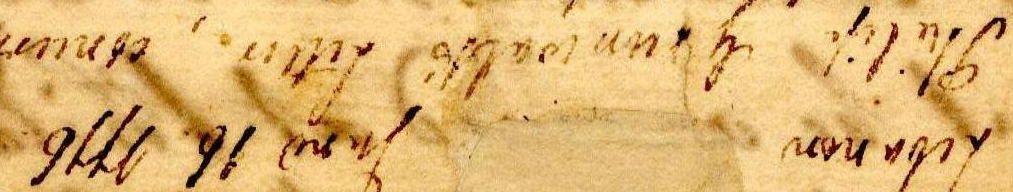Lebanon June 16 1776
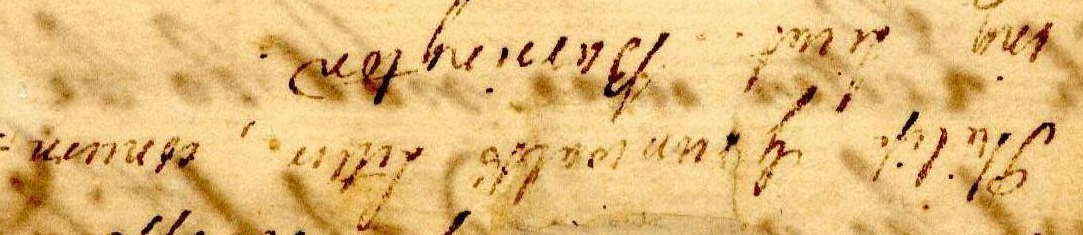Philip Greenwald's Letter, concern-
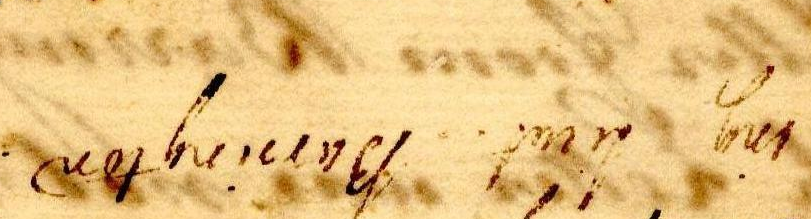-ing Lieut. Barrington
